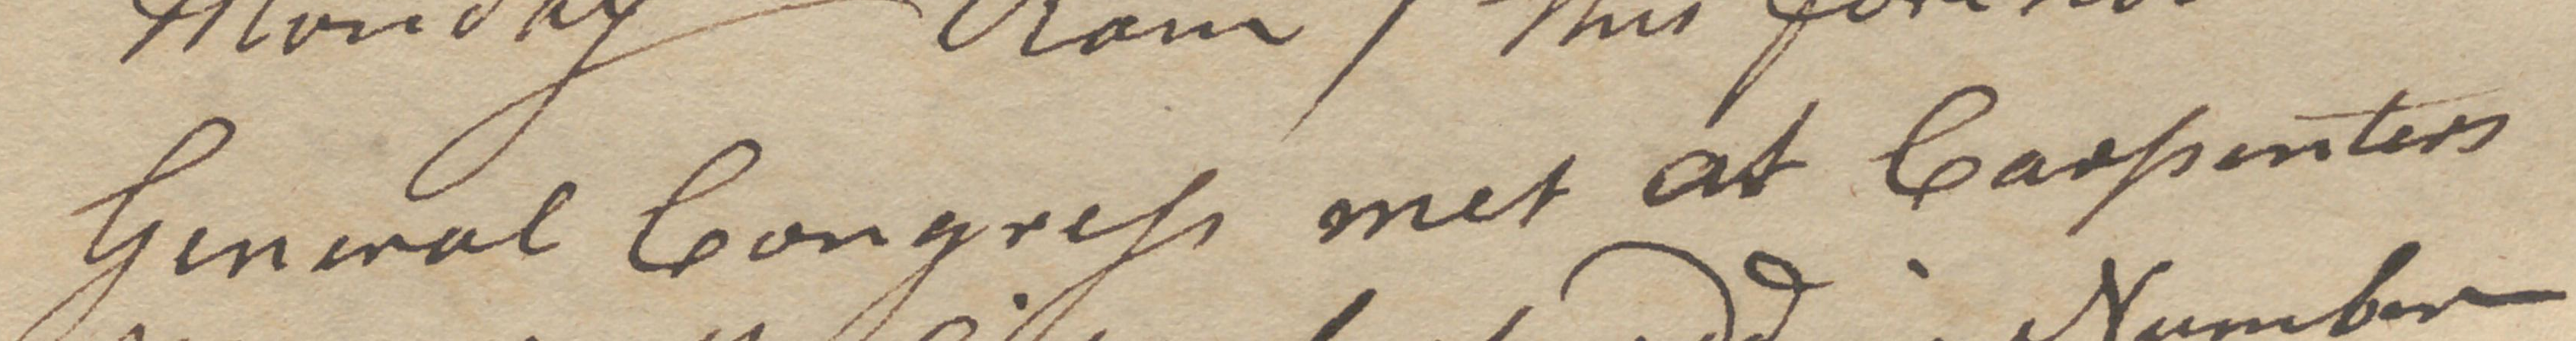General Congress met at Carpenters
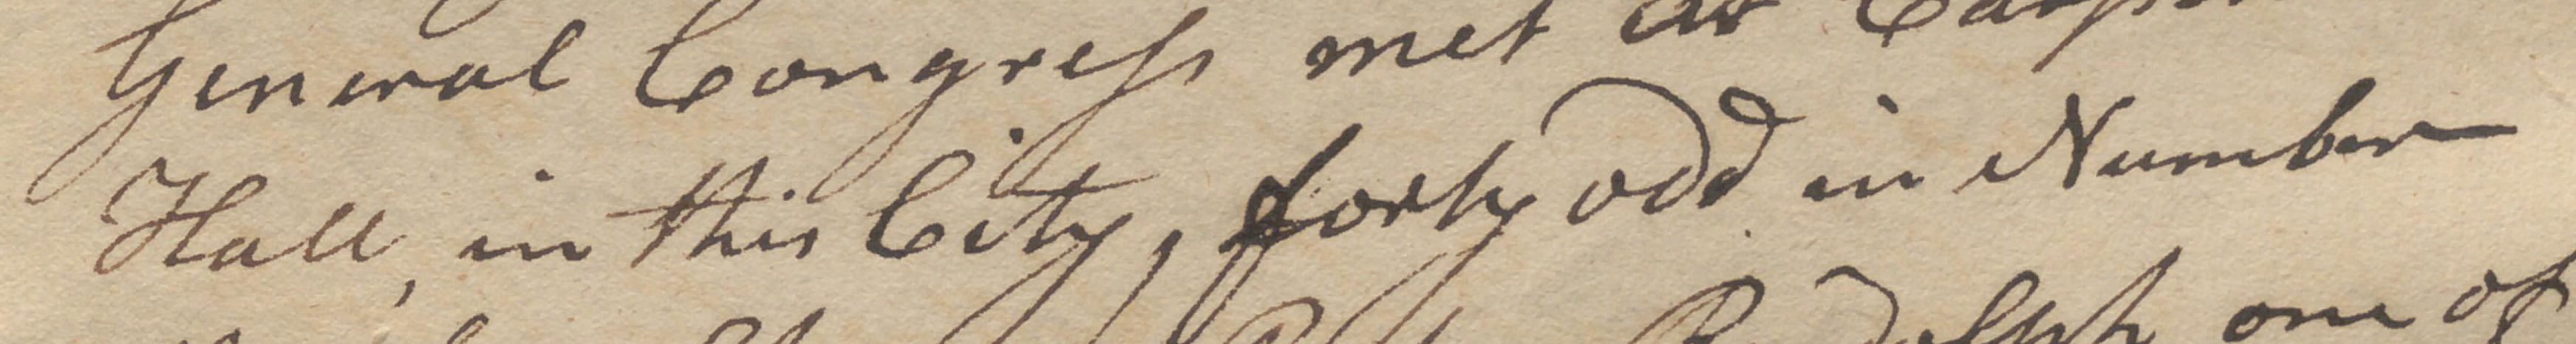Hall in this City, forty odd in Number
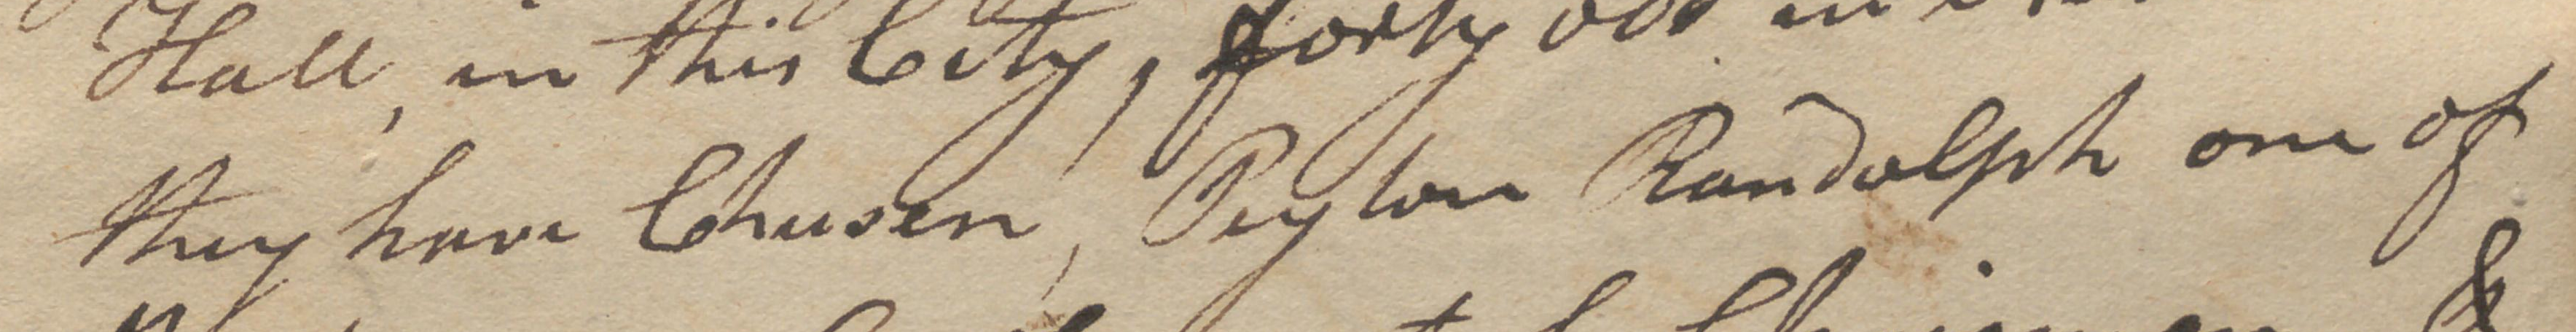they have Chusen Peyton Randolph one of
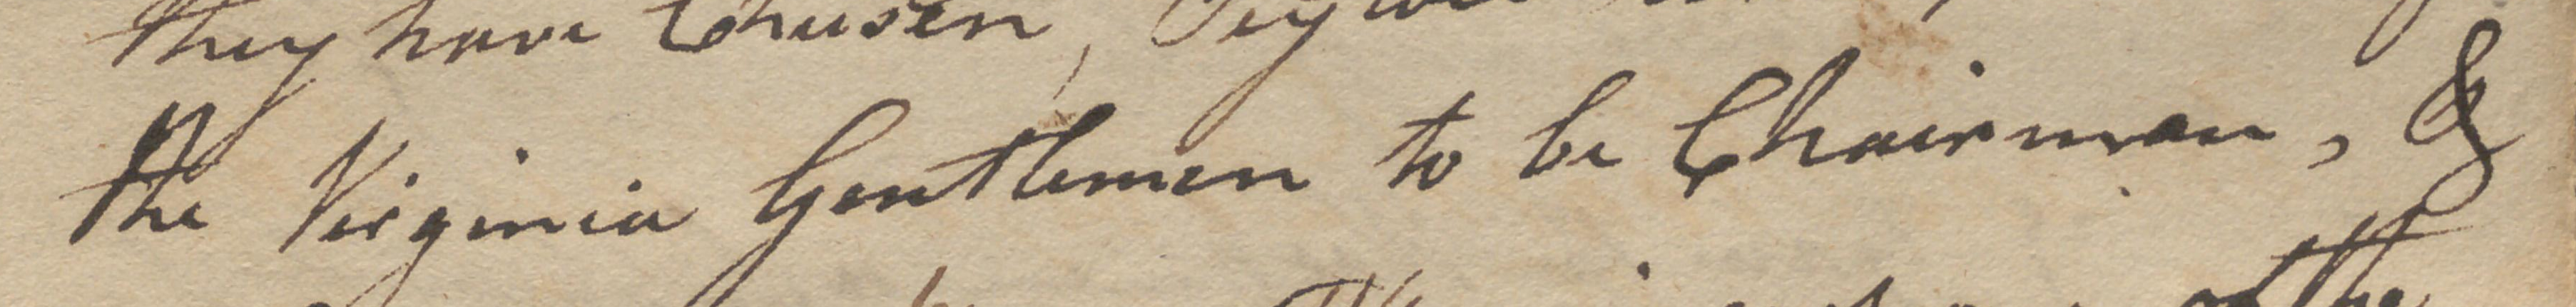the Virginia Gentlemen to be Chairman, &
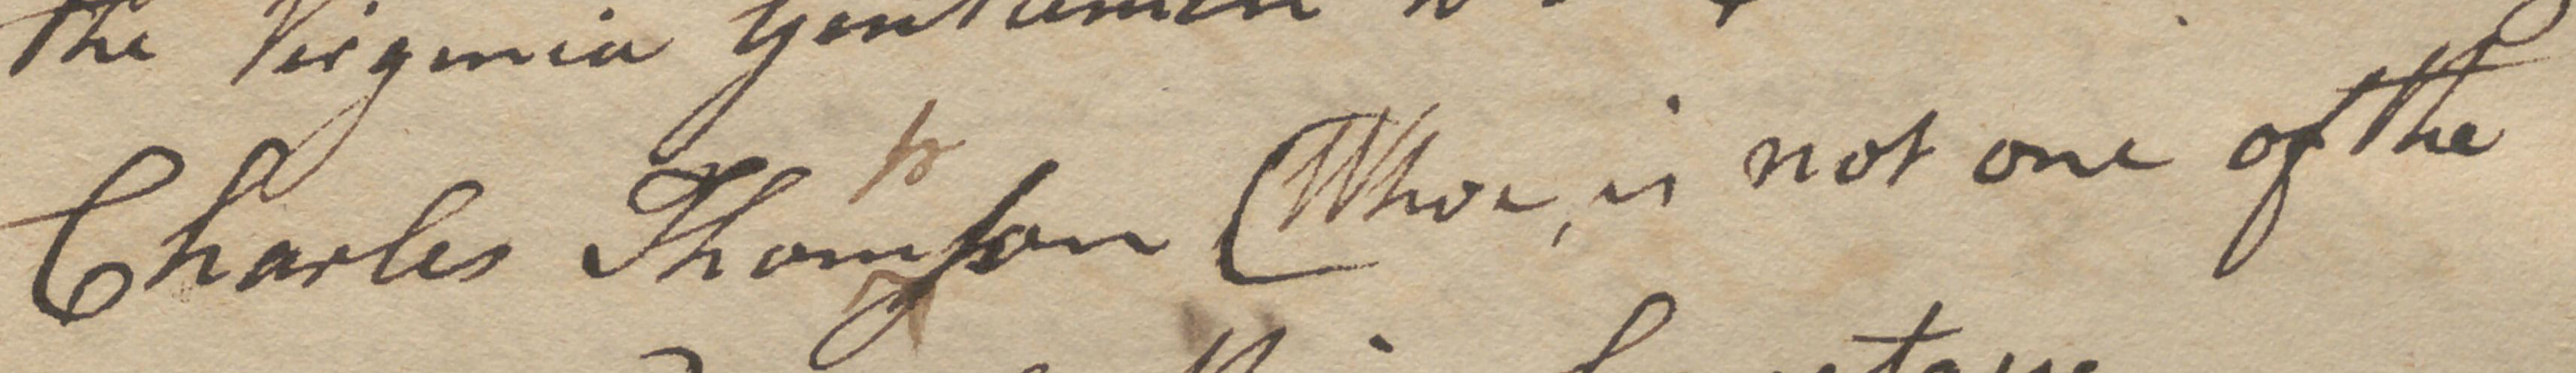Charles Thomson (Whoe is not one of the
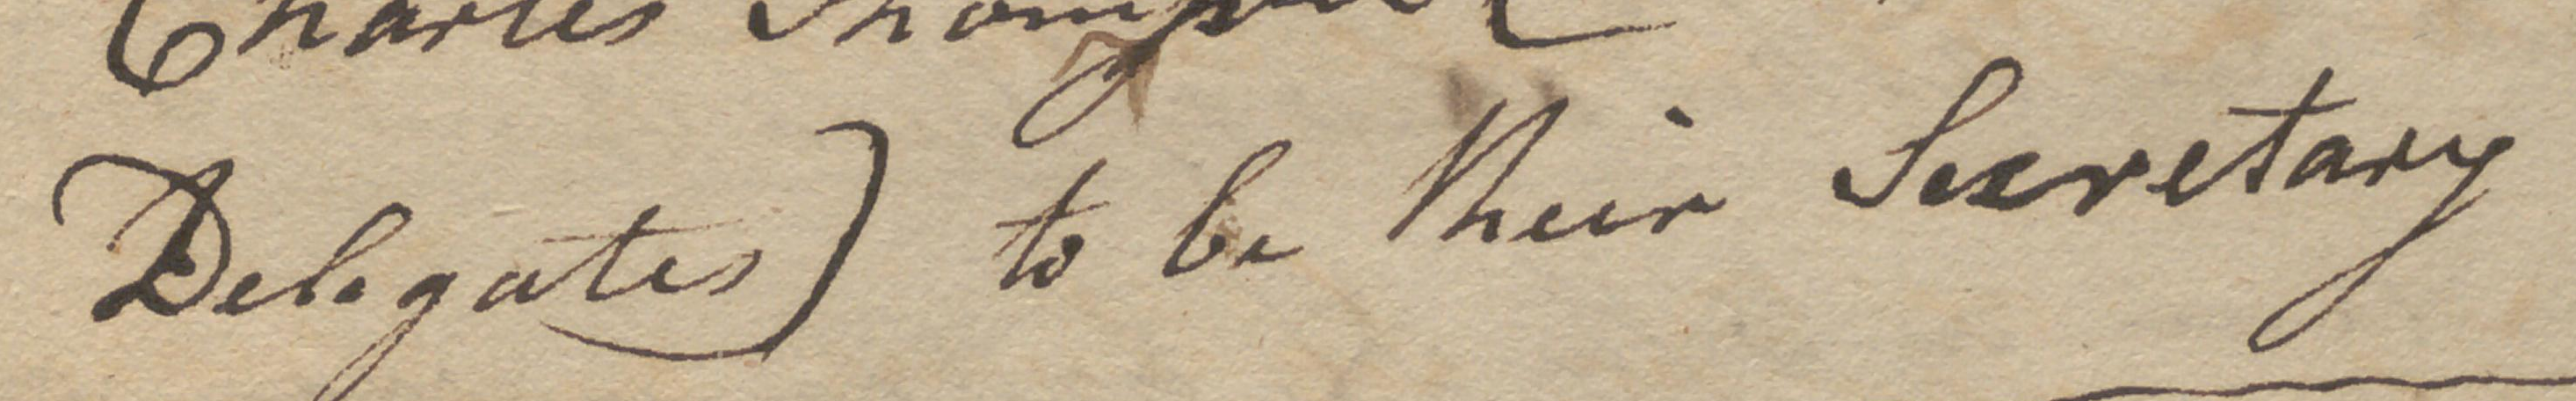Delegates) to be their Secretary
